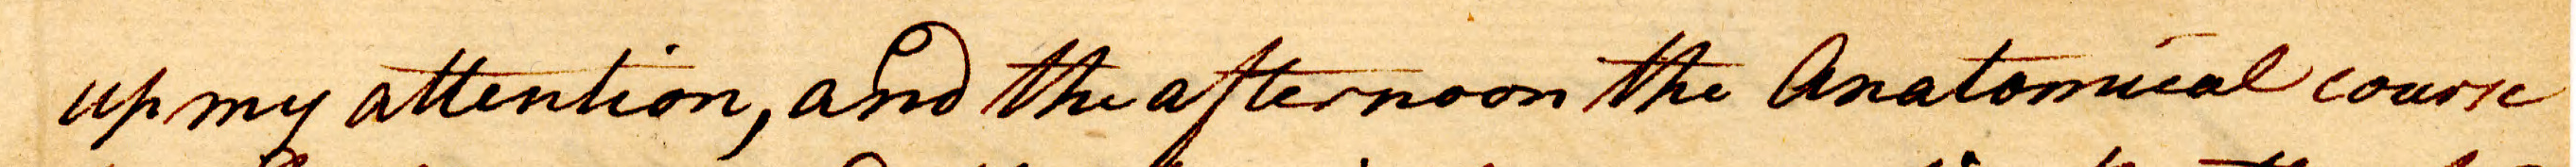up my attention, and the afternoon the Anatomical course
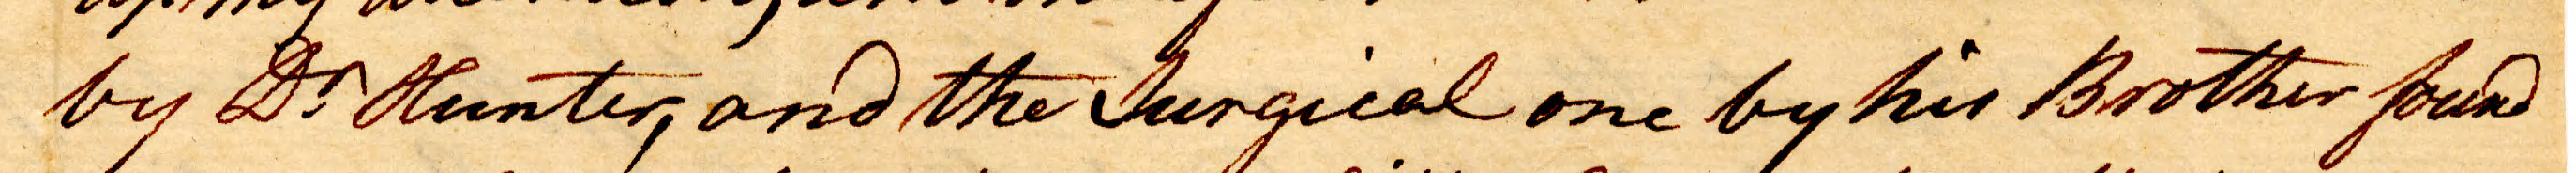by D^r. Hunter, and the Surgical one by his Brother found
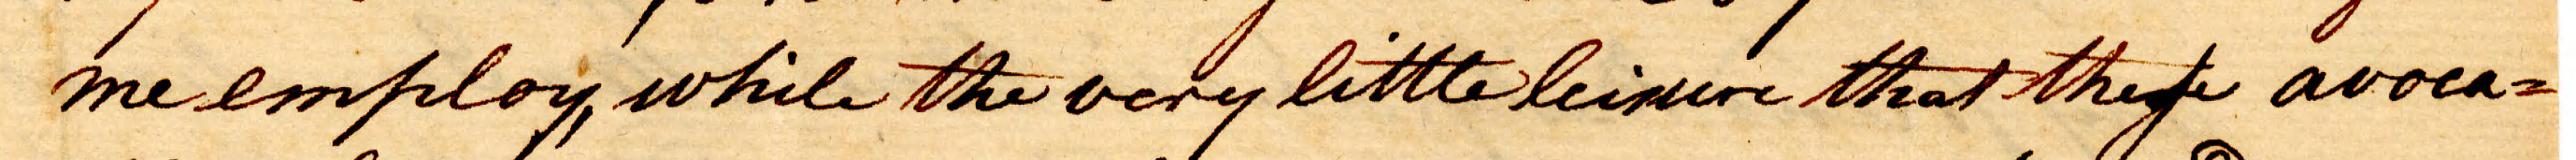me employ, while the very little leisure that these avoca-
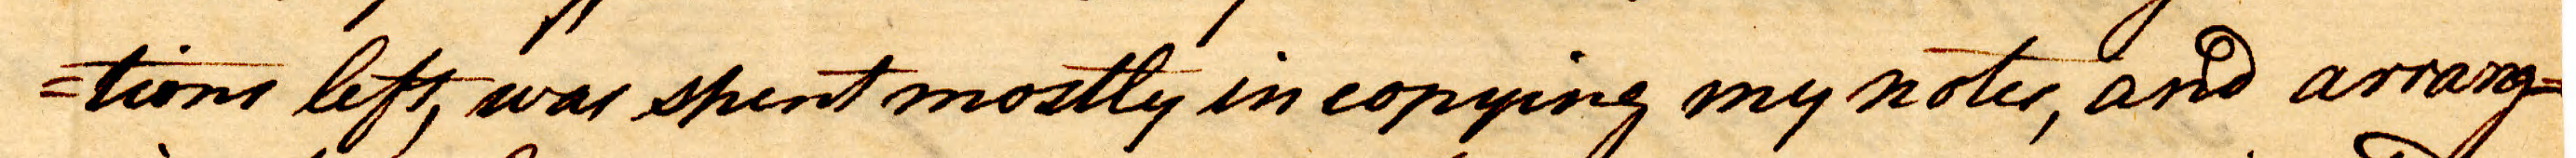-tions left, was spent mostly in copying my notes, and arrang-
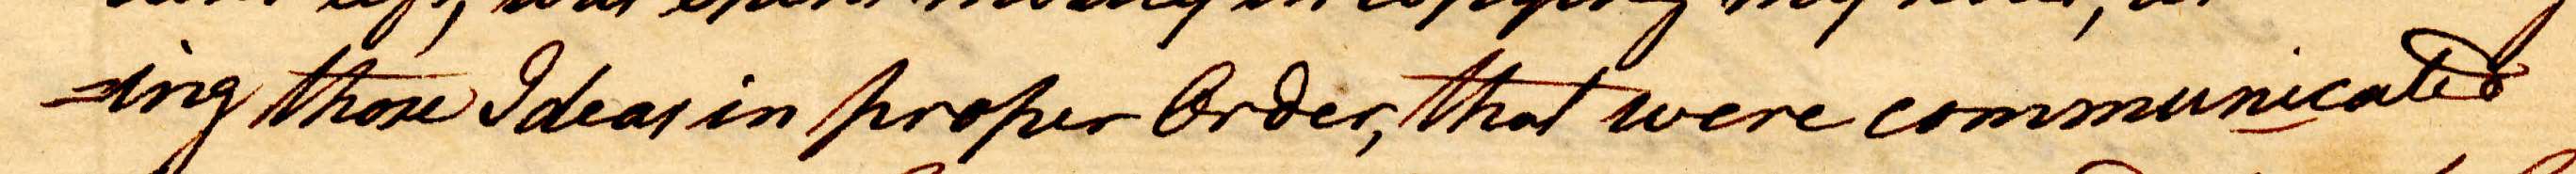-ing those Ideas in proper Order, that were communicated
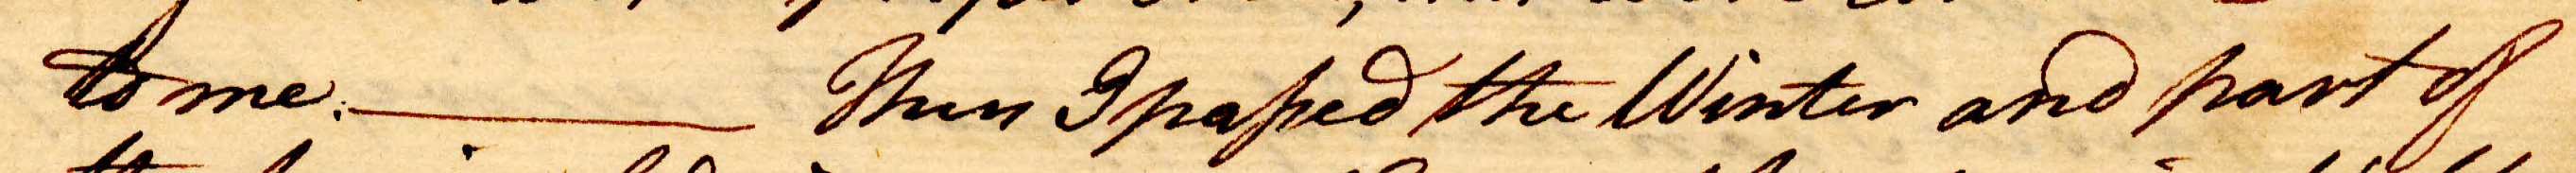to me.- Then I passed the Winter and part of
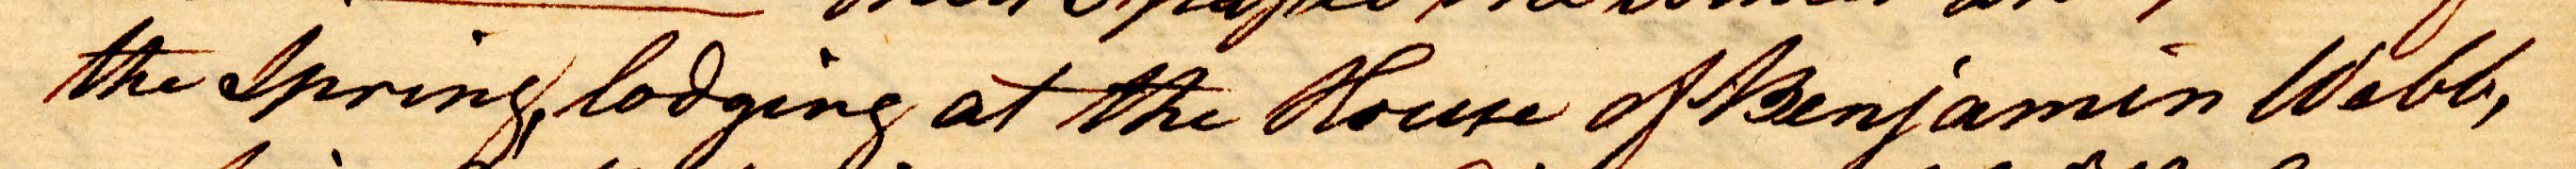the Spring, lodging at the House of Benjamin Webb,
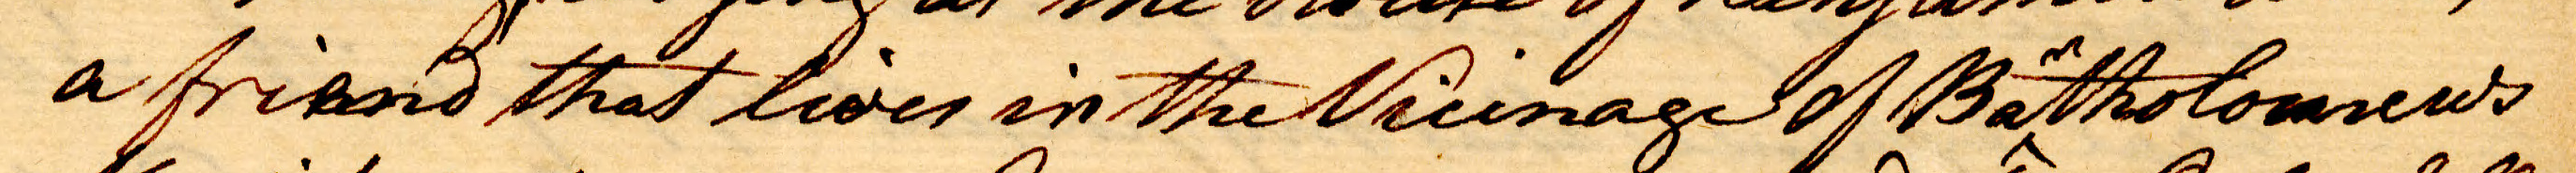a friend that lives in the Vicinage of Ba^rtholomews
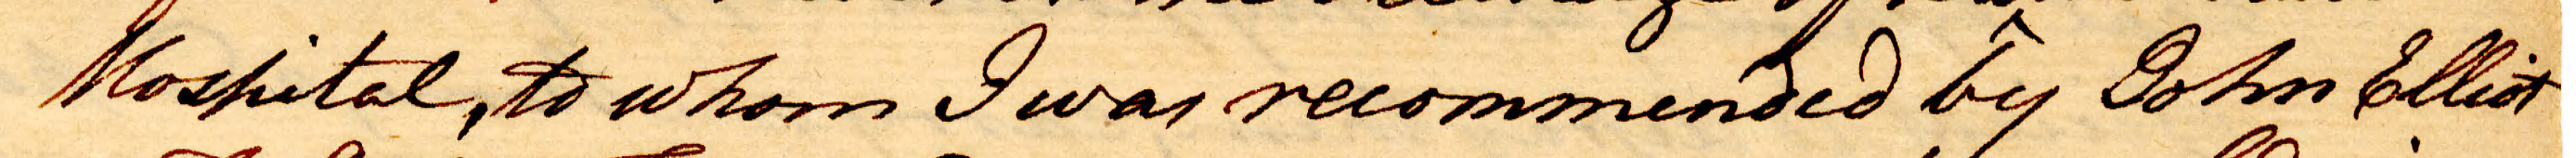Hospital, to whom I was recommended by John Elliot
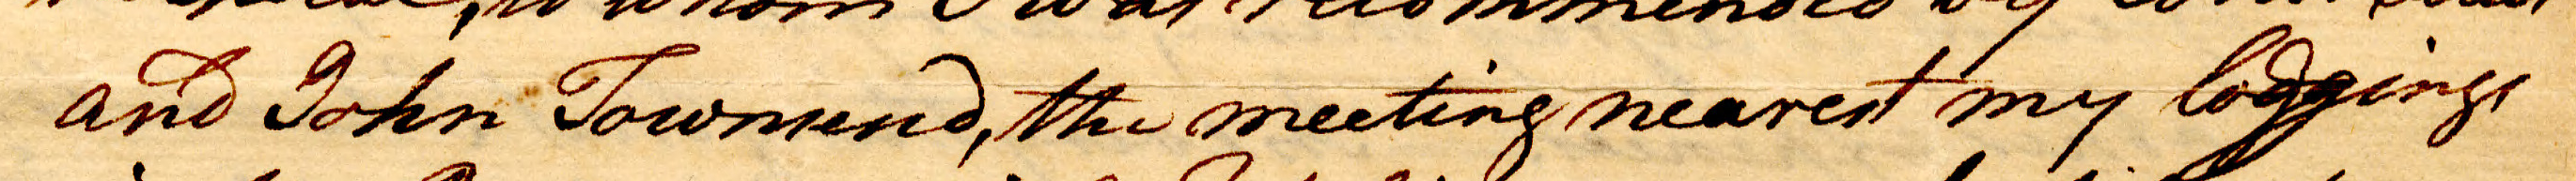and John Townsend, the meeting nearest my lodgings
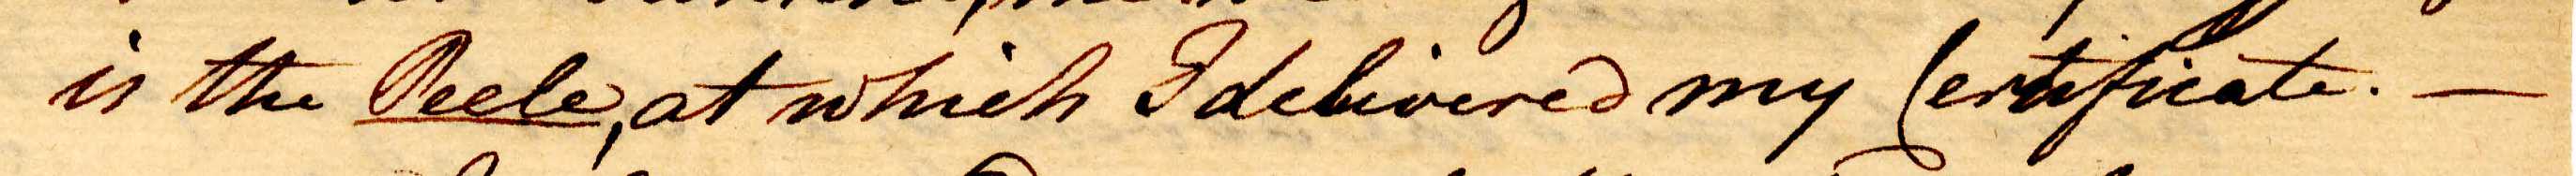in the Peele, at which I delivered my Certificate.-
